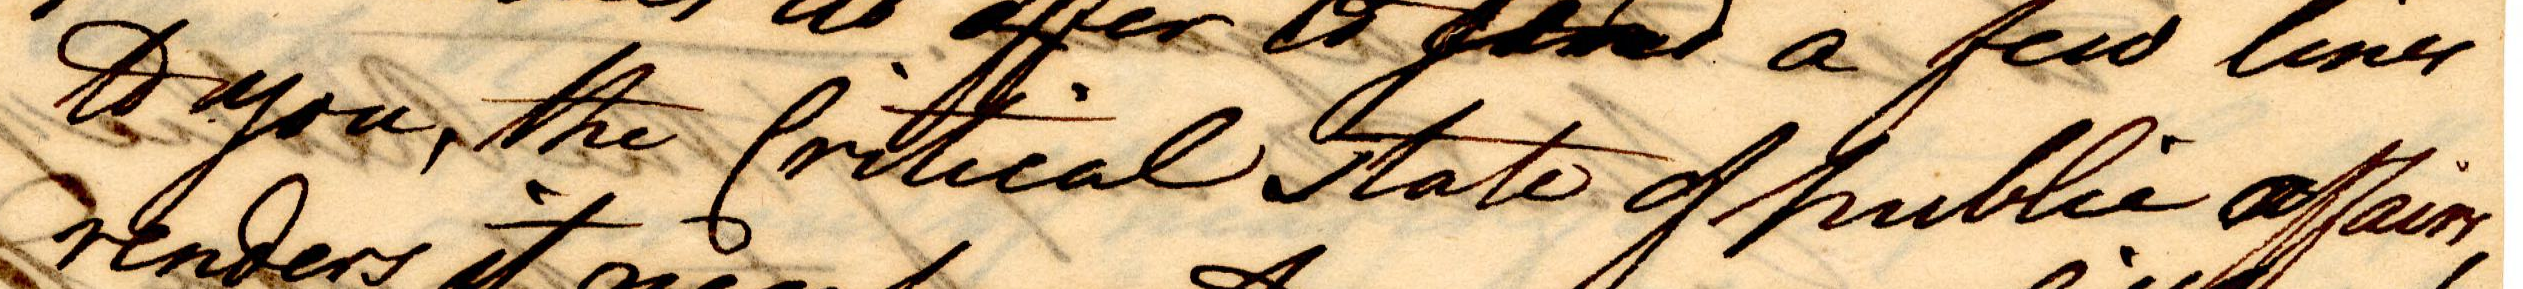to you, the Critical State of public affairs,
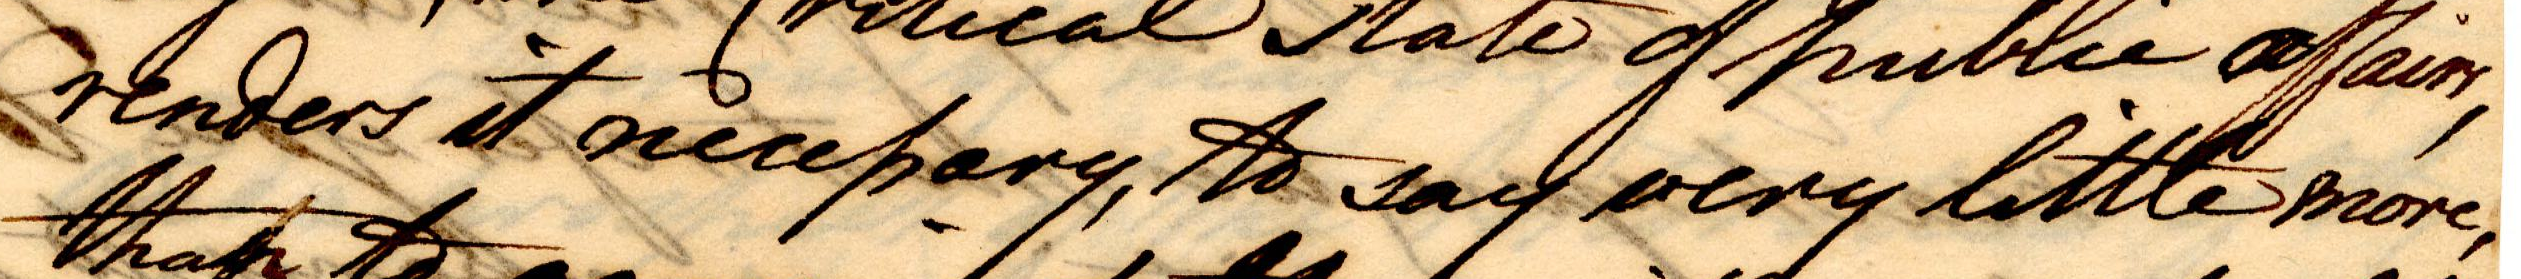renders it necessary, to say very little more,
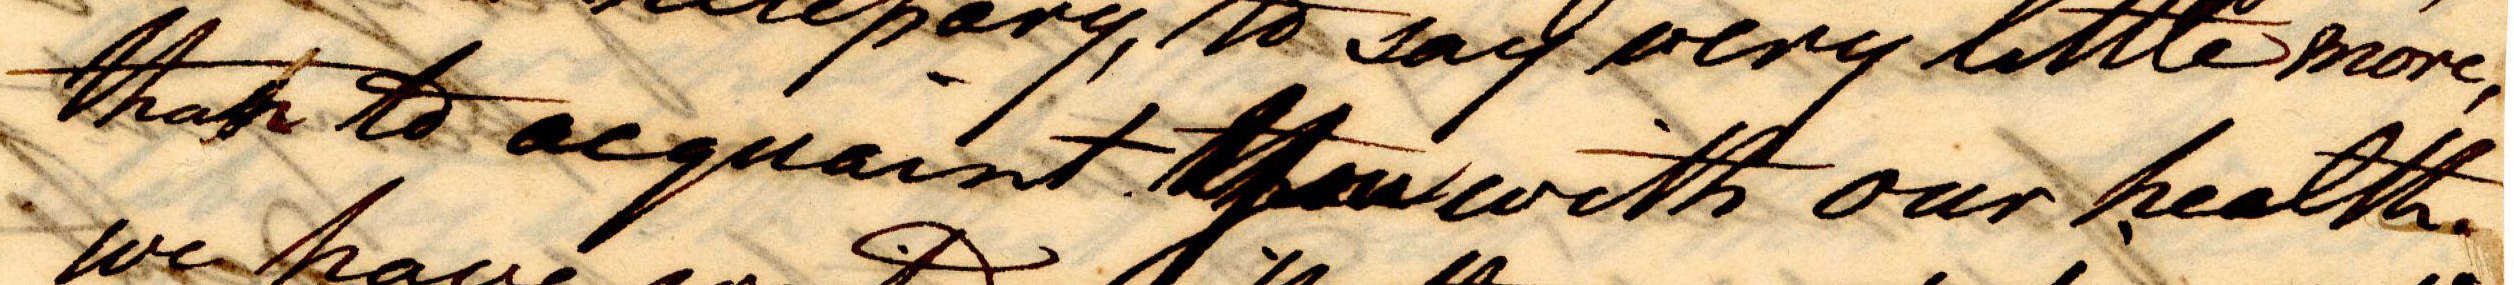than to acquaint You with our health.
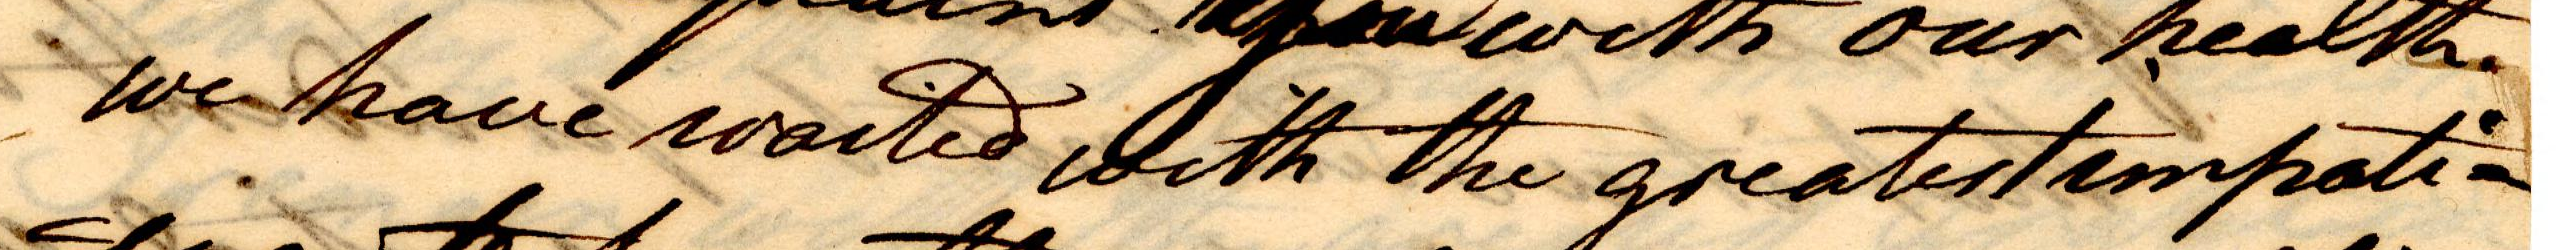we have waited with the greatest impati-
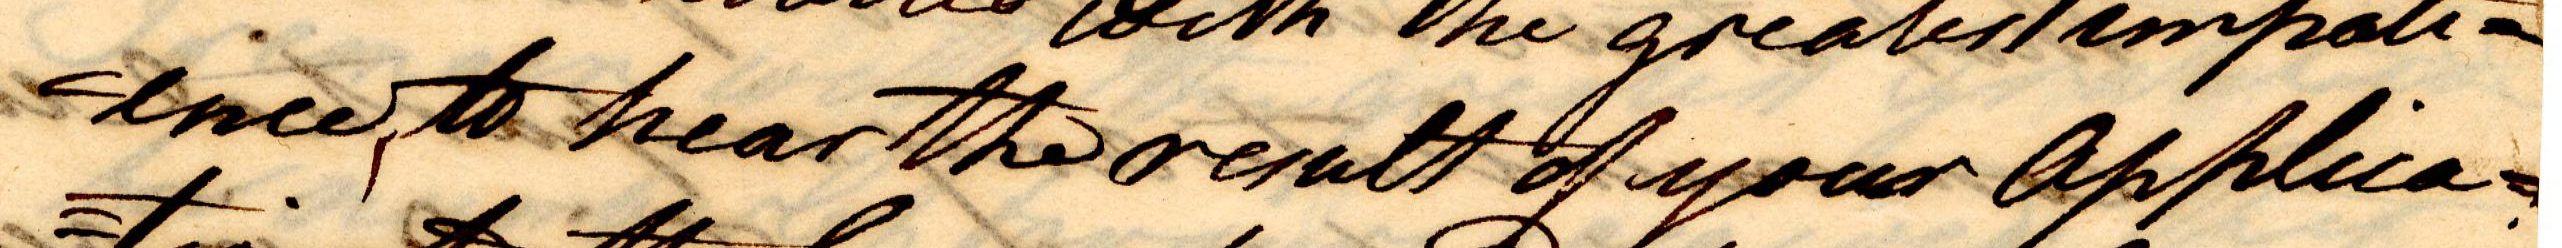-ence, to hear the result of your Applica-
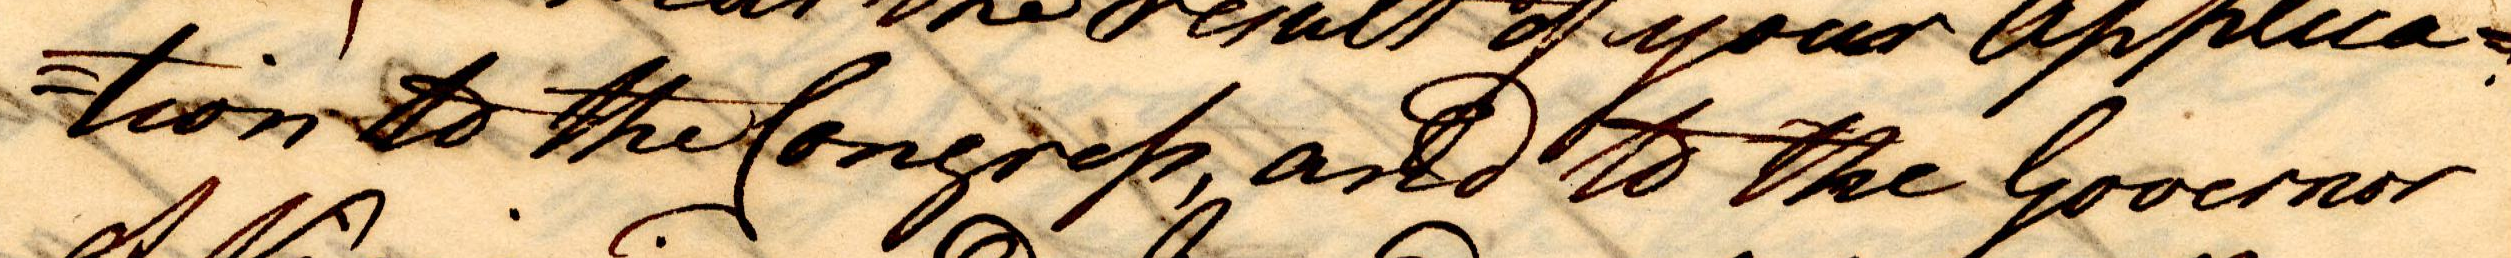-tion to the Congress, and to the Governor
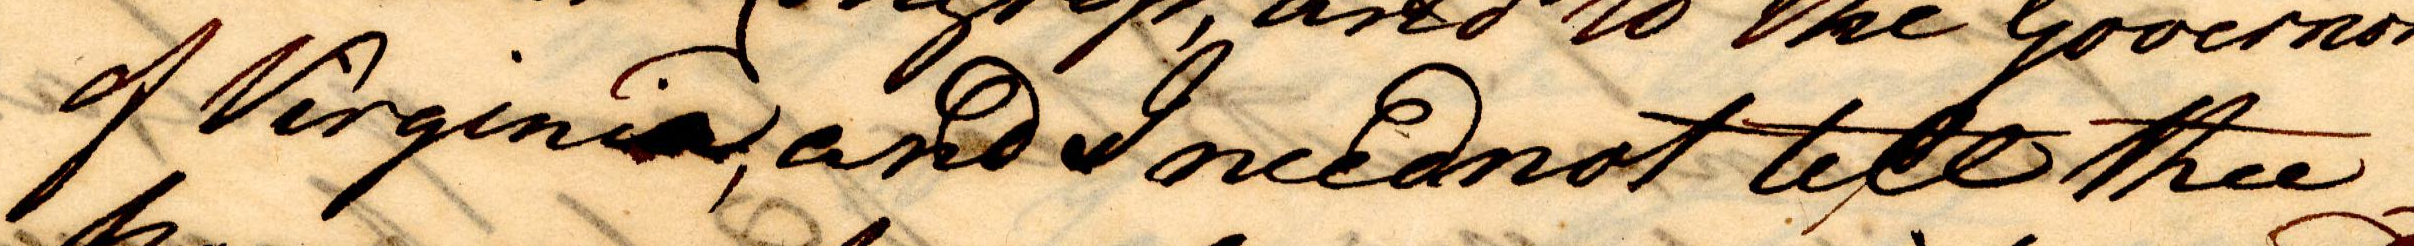of Virginia, and I need not tell thee
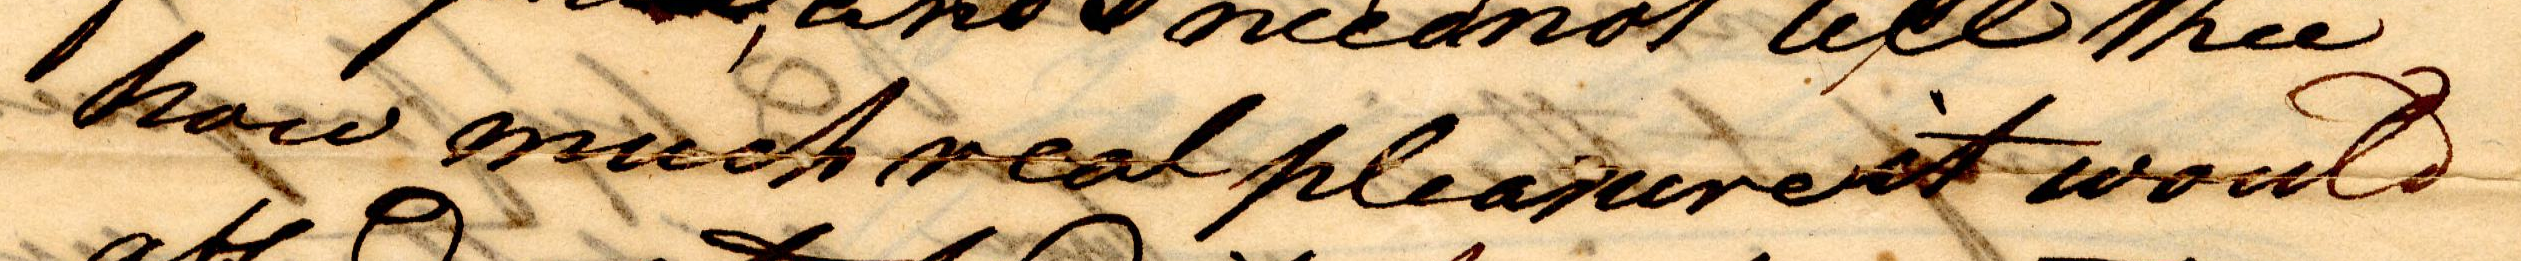how much real pleasure it would
